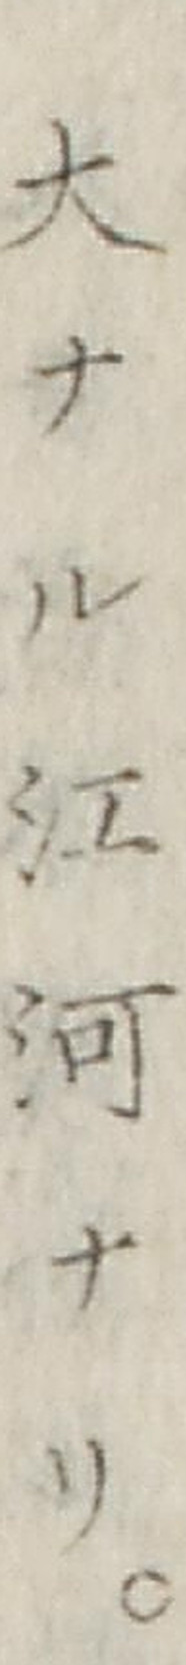大ナル江河ナリ。
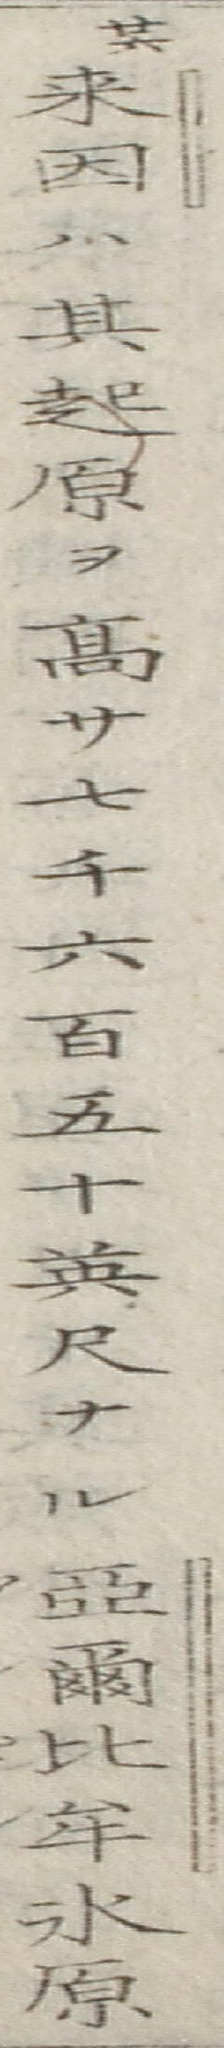廿六来因ハ其起源ヲ高サ七千六百五十英尺ナル亜爾比牟氷原
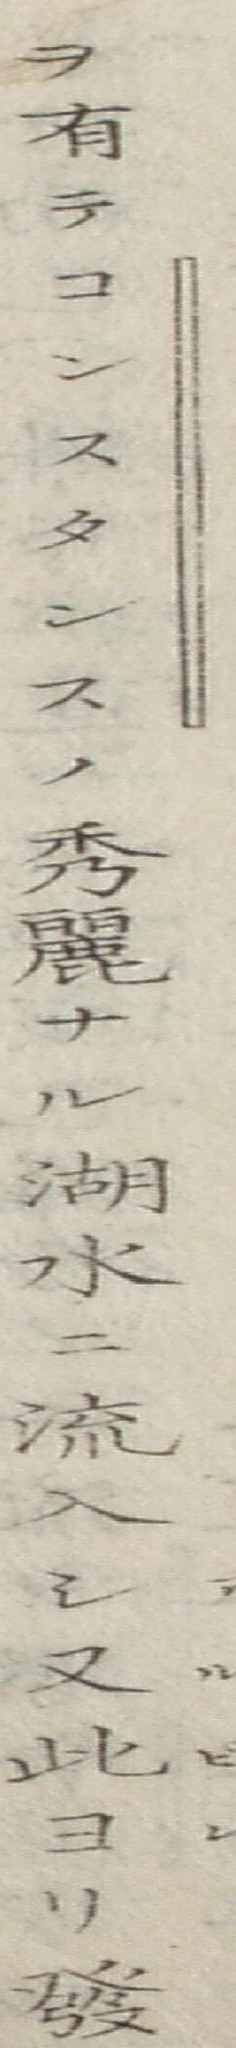ヲ有テコンスタンスノ秀麗ナル湖水ニ流入シ又此ヨリ発
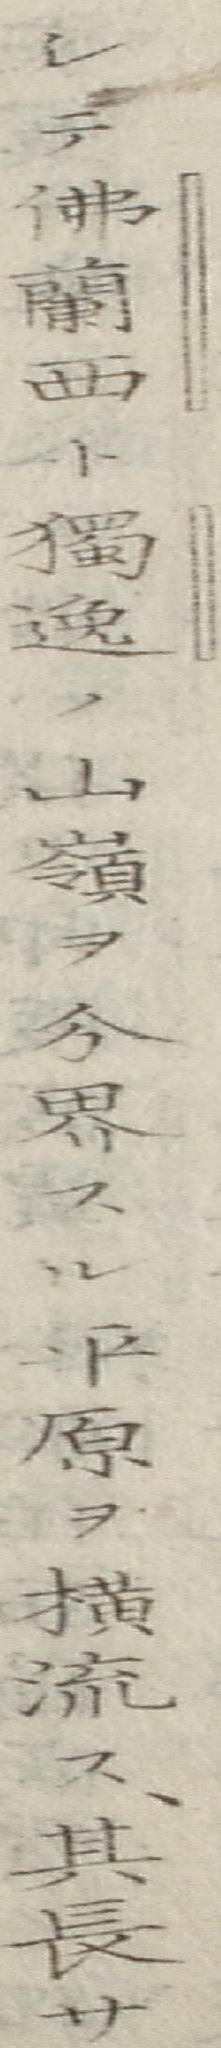シテ仏蘭西ト独逸ノ山嶺ヲ分界スル平原ヲ横流ス、其長サ
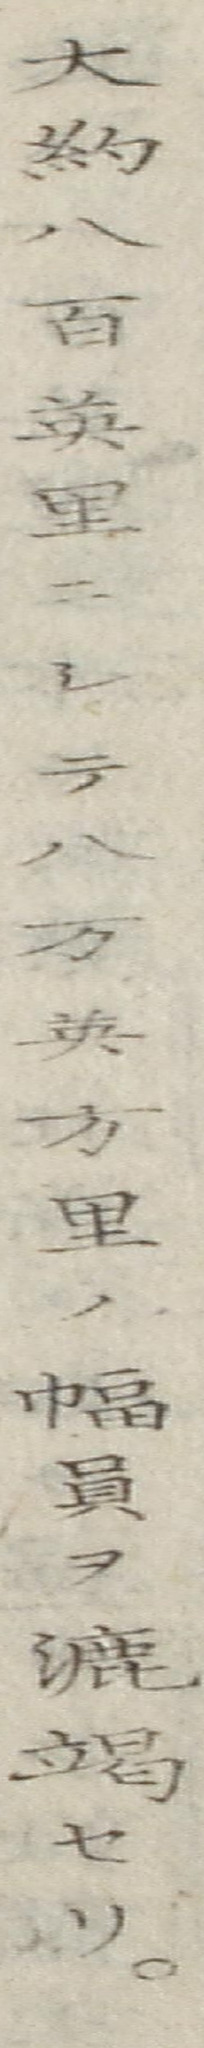大約八百英里ニシテ八万英方里ノ幅員ヲ濾竭セリ。
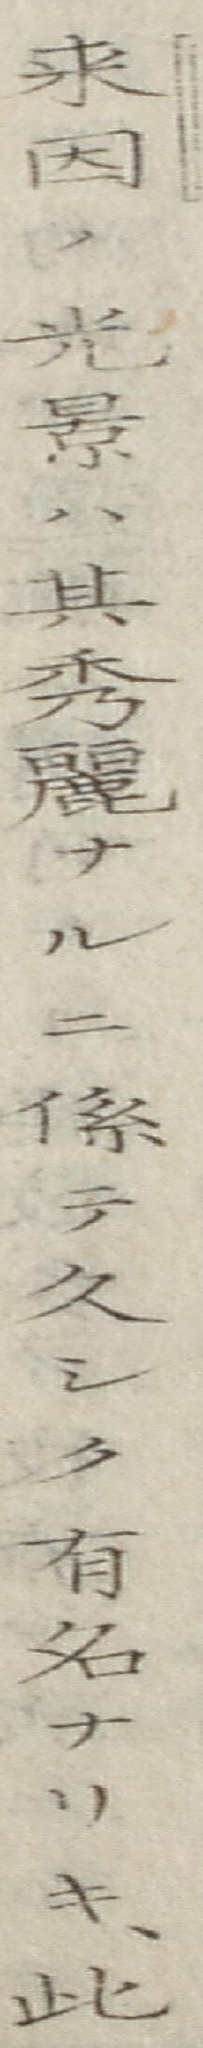来因ノ光景ハ其秀麗ナルニ係テ久シク有名ナリキ、此
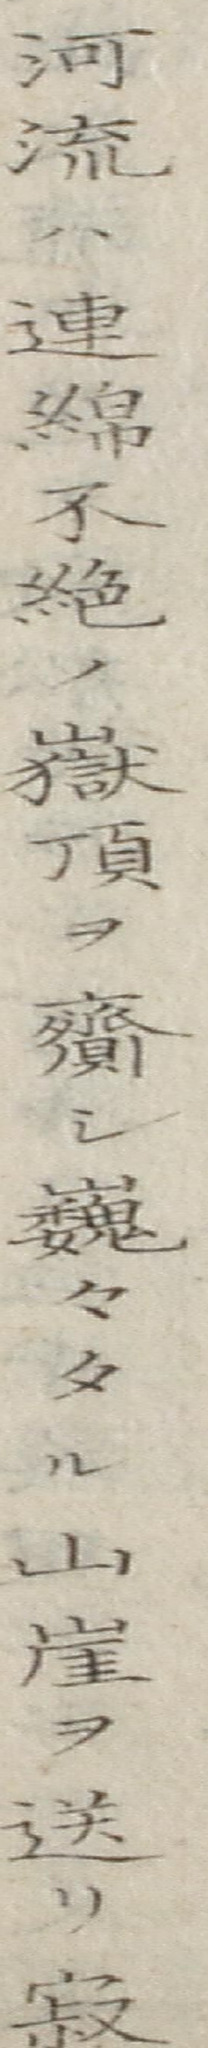河流ハ連綿不絶ノ嶽頂ヲ斉シ巍々タル山崖ヲ送リ寂
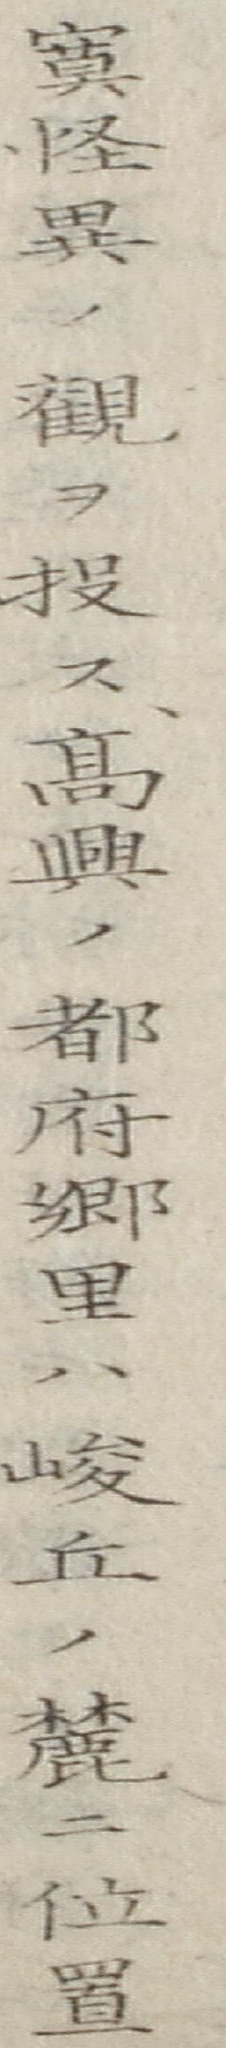寞怪異ノ観ヲ投ス、高興ノ都府郷里ハ峻丘ノ麓ニ位置
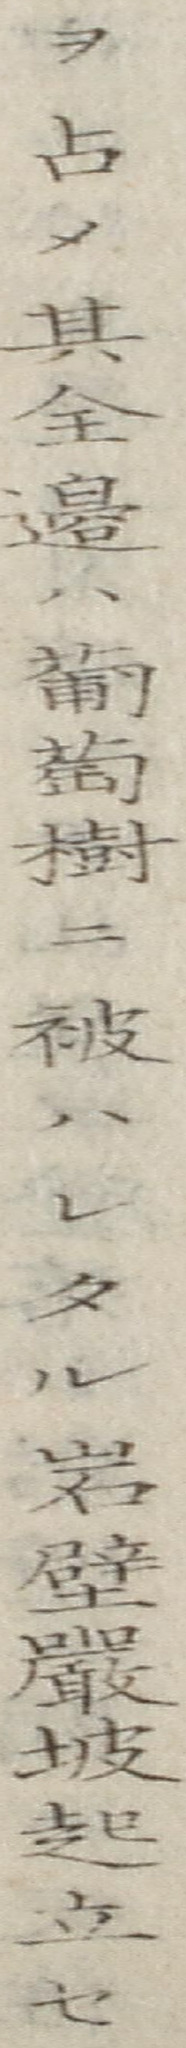ヲ占メ其全辺ハ葡萄樹ニ被ハレタル岸壁厳坡起立セ
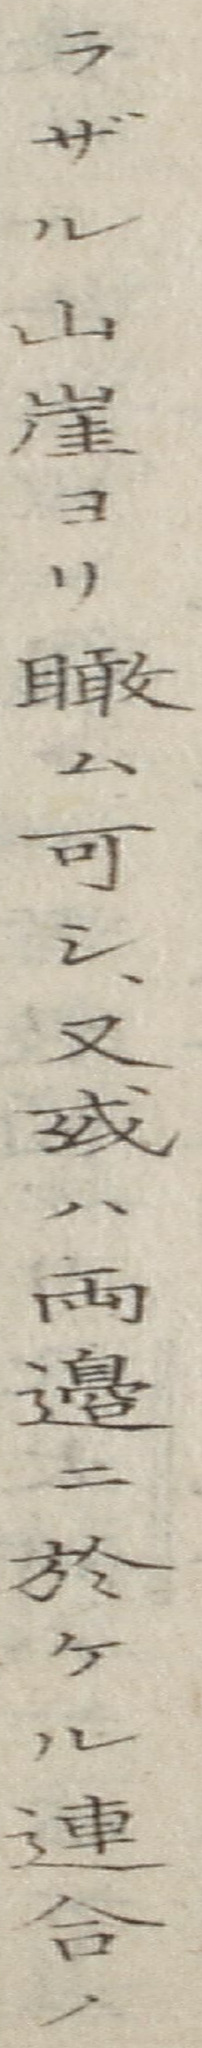ラザル山崖ヨリ瞰ム可シ、又或両辺ニ於ケル連合ノ
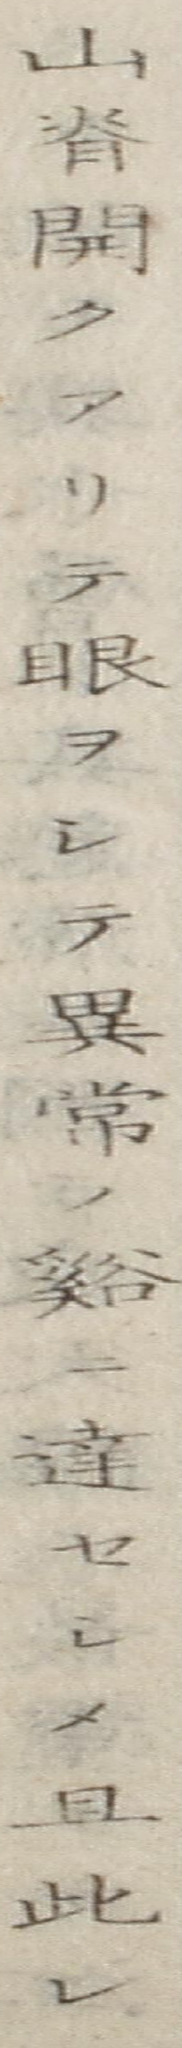山背開クアリテ眼ヲシテ異常ノ谿ニ達セシメ且此レ
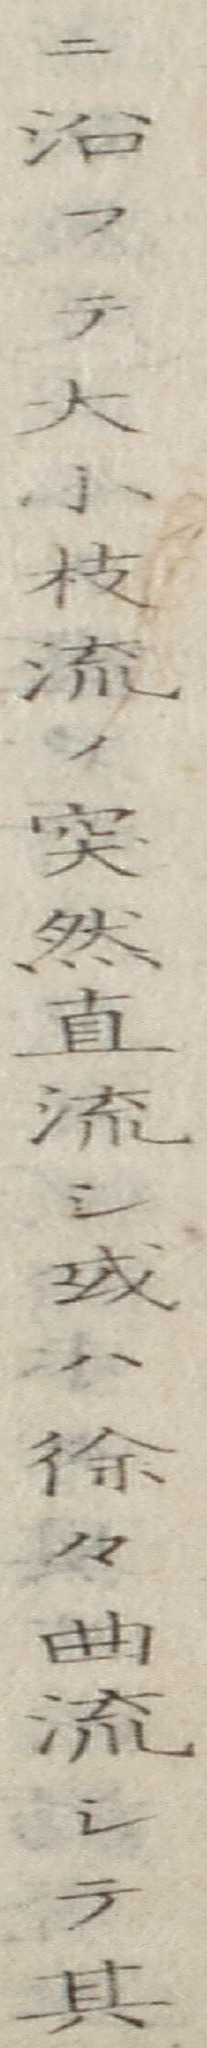ニ沿フテ大小枝流ノ突然直流シ或ハ徐々曲流シテ其
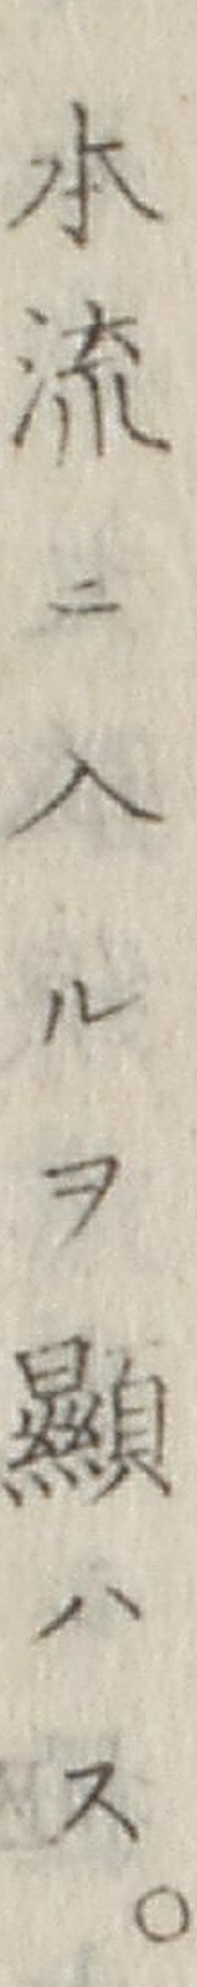水流ニ入ルヲ顕ハス。
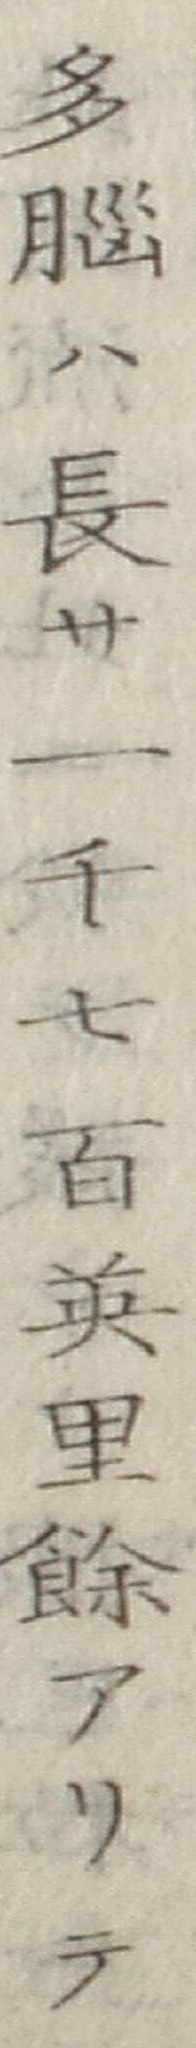多脳ハ長サ一千七百英里余アリテ
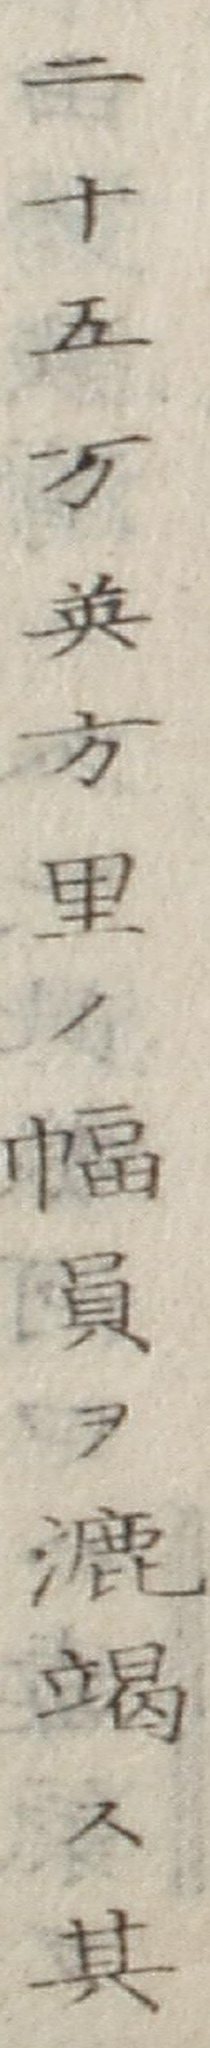二十五万英方里ノ幅員ヲ濾竭ス其
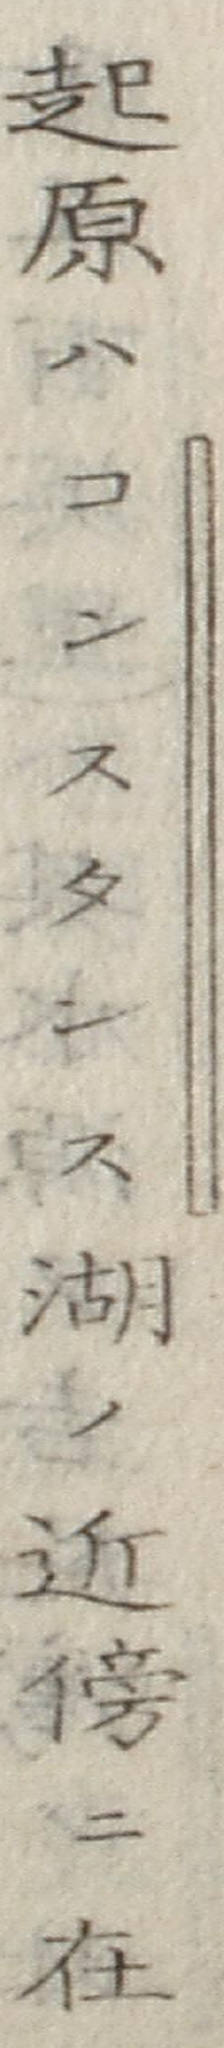起原ハコンスタンス湖ノ近傍ニ在
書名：地形論　巻二
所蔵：東京大学地震研究所図書室 Earthquake Research Institute Library, The University of Tokyo, JAPAN
